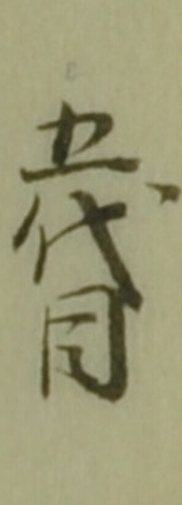五代目
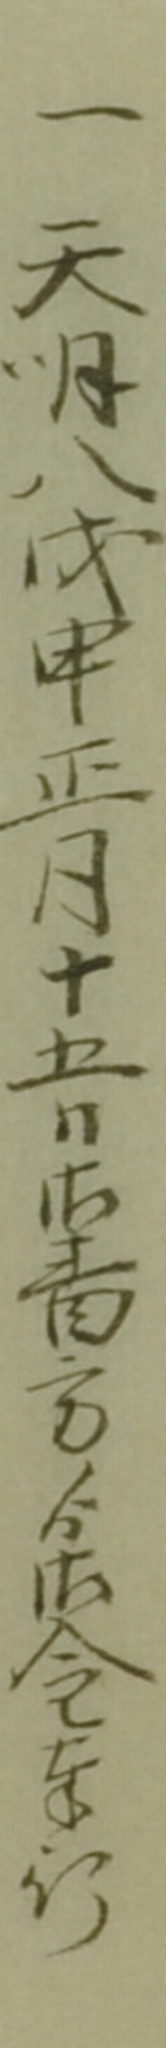一天明八戊申正月十五日御番方ゟ御金奉行
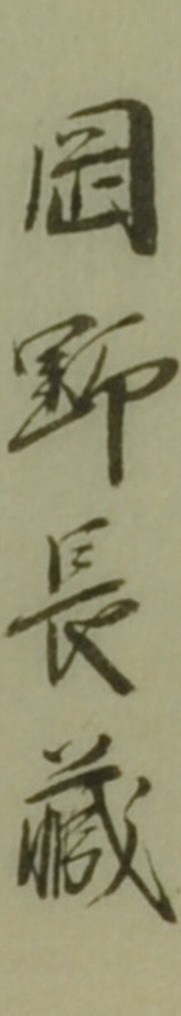岡野長蔵
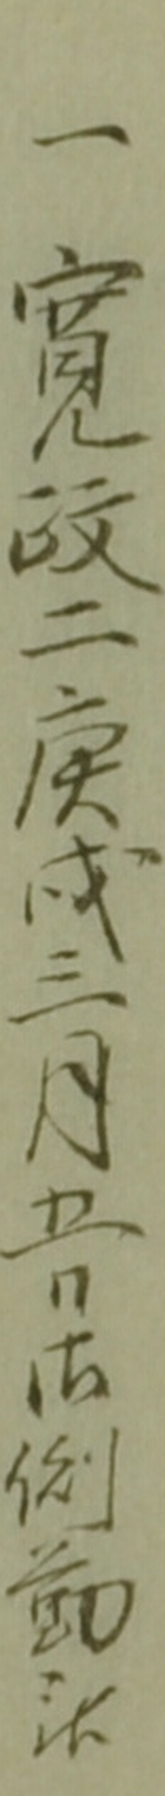一寛政二庚戌三月五日御側勤被
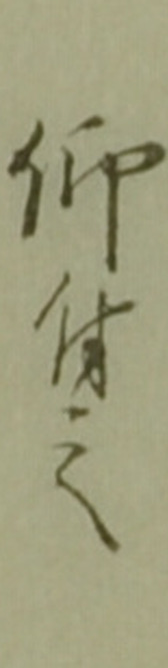仰付之
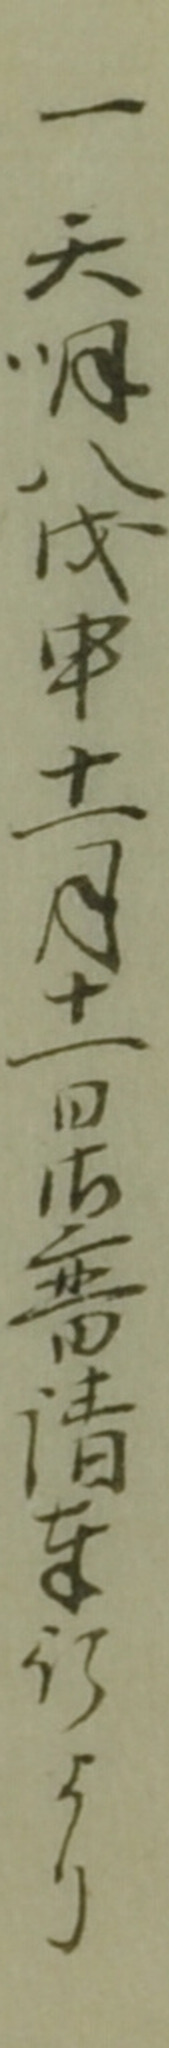一天明八戊申十一月十一日御普請奉行より
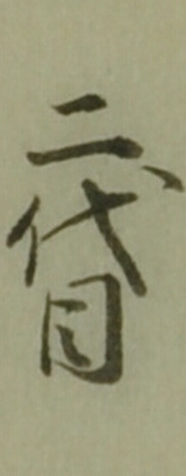二代目
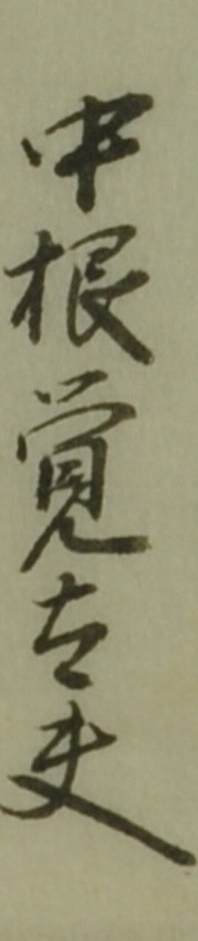中根覚太夫
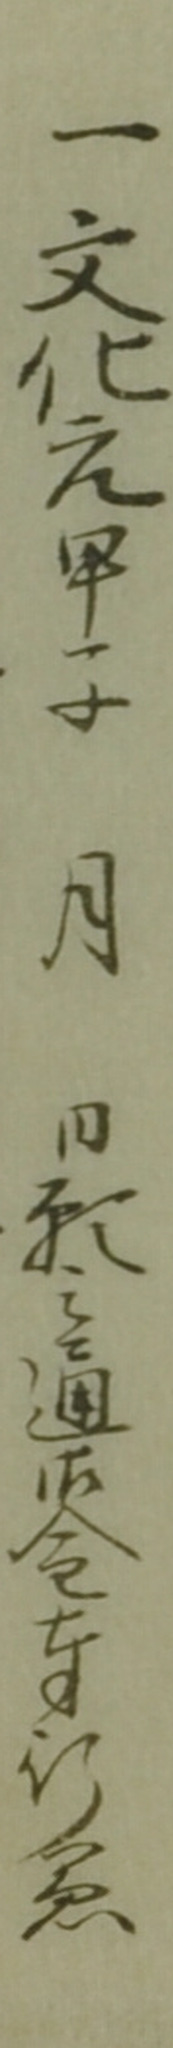一文化元甲子月被願之通御金奉行兼
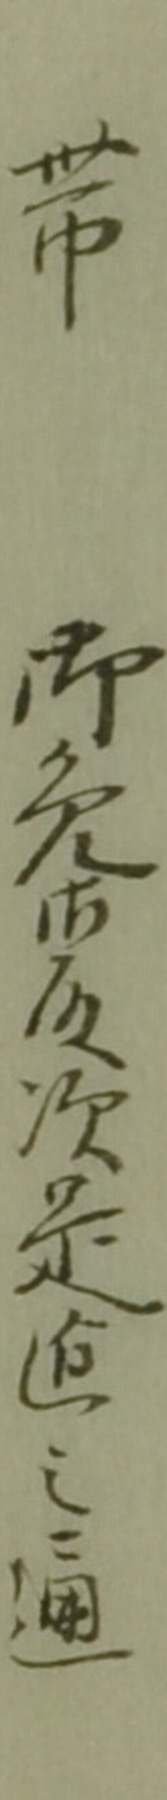帯御免御取次是迄之通
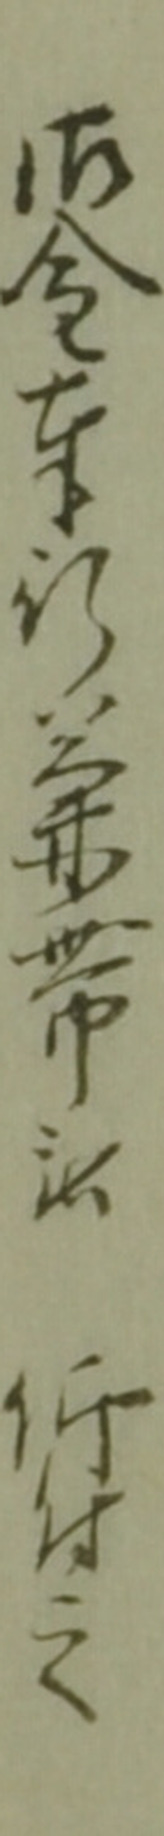御金奉行兼帯被仰付之
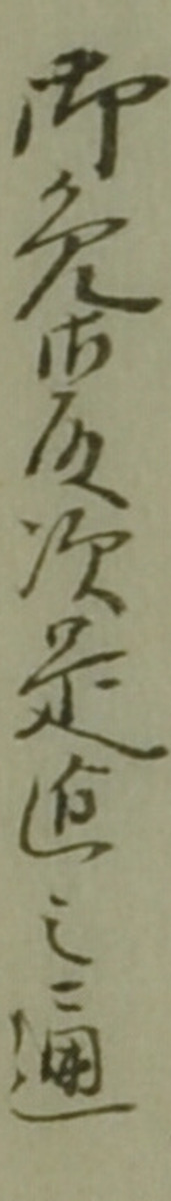帯御免御取次是迄之通
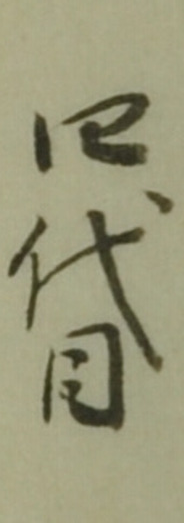四代目

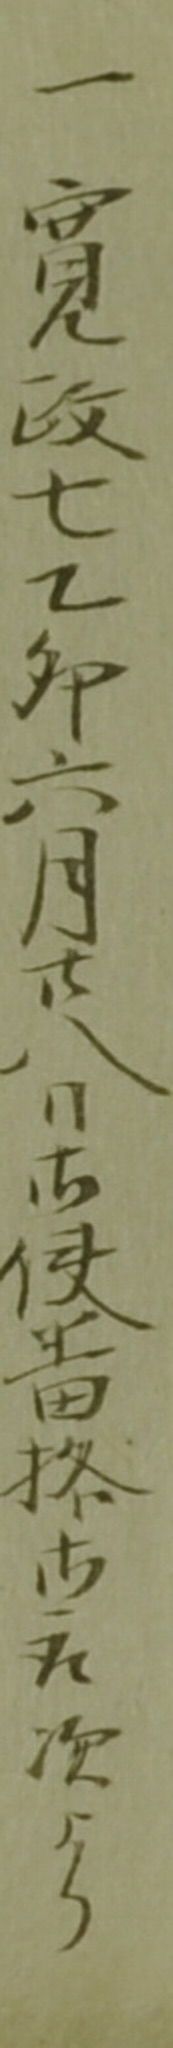一寛政七乙卯六月廿八日御使番格御取次より
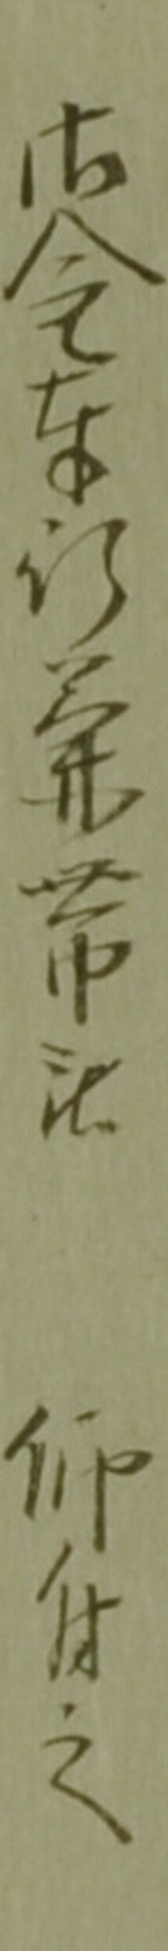御金奉行兼帯被仰付之
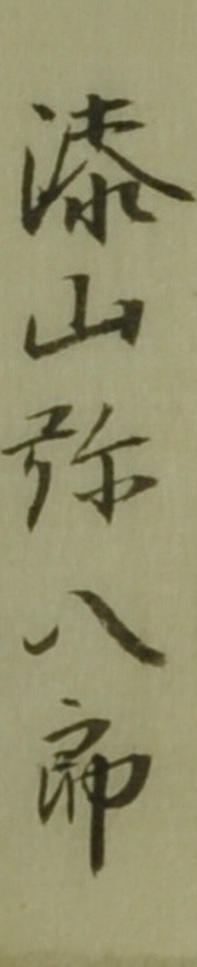漆山弥八郎
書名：諸御役代々録（七）
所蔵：伊那市立高遠町図書館・合同会社AMANE
